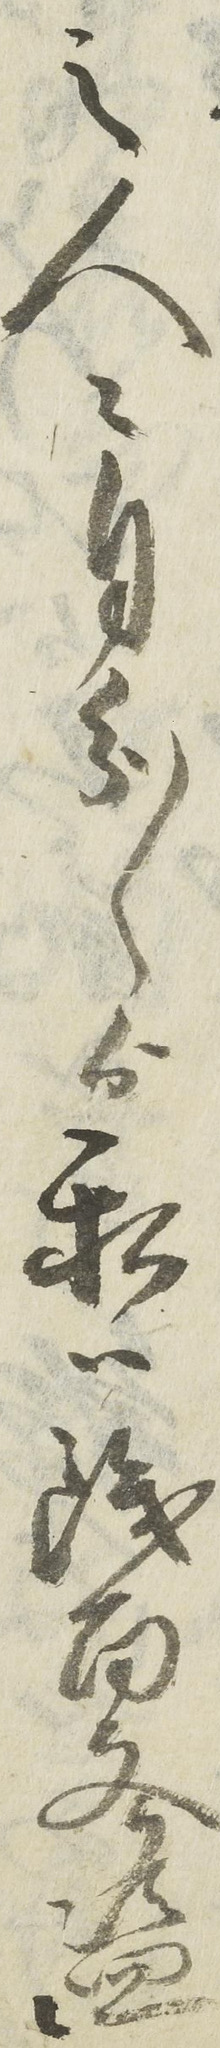之人〻自分〳〵ゟ私は銭百文盗
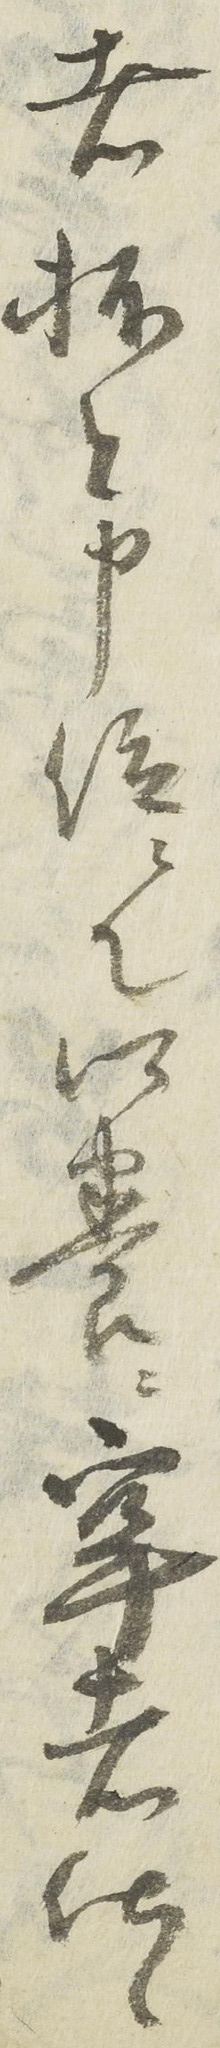者抔と申位ニて御養ニ牢者仕候
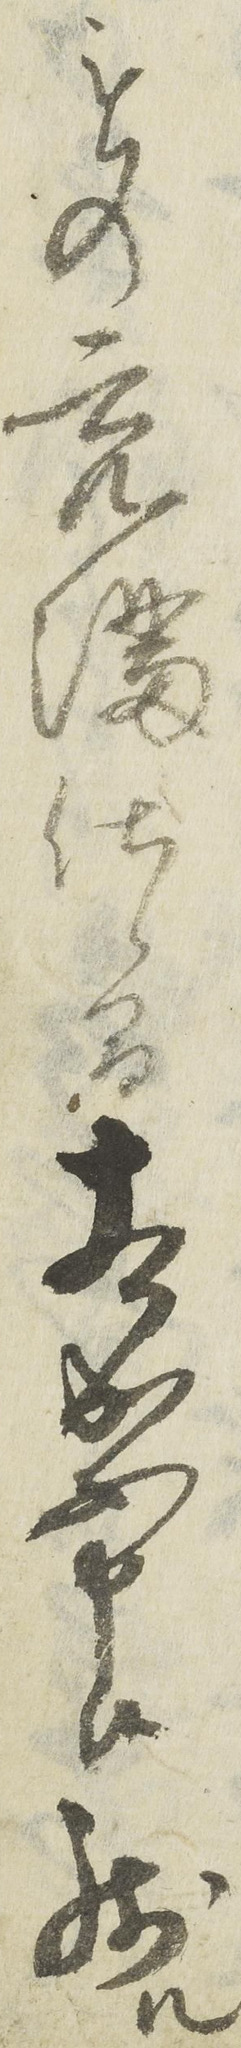もの充満仕候間相成不申候残ル

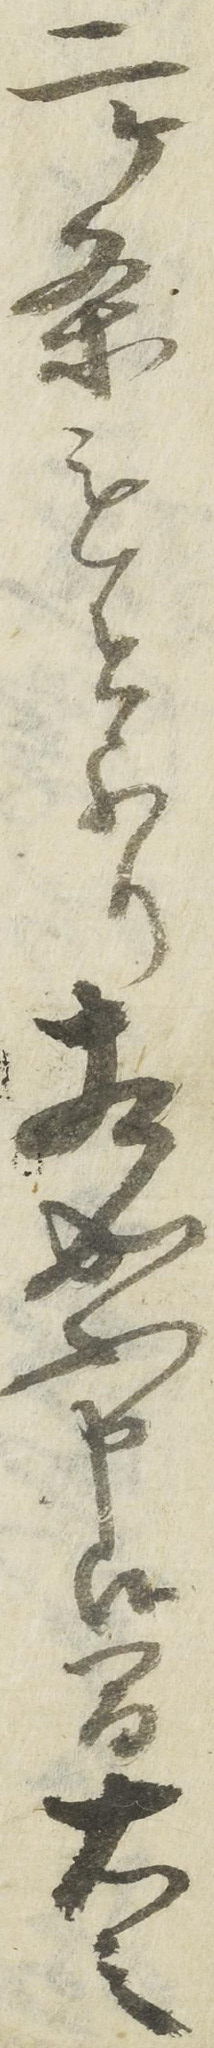ニヶ条もとより相成不申候間右之
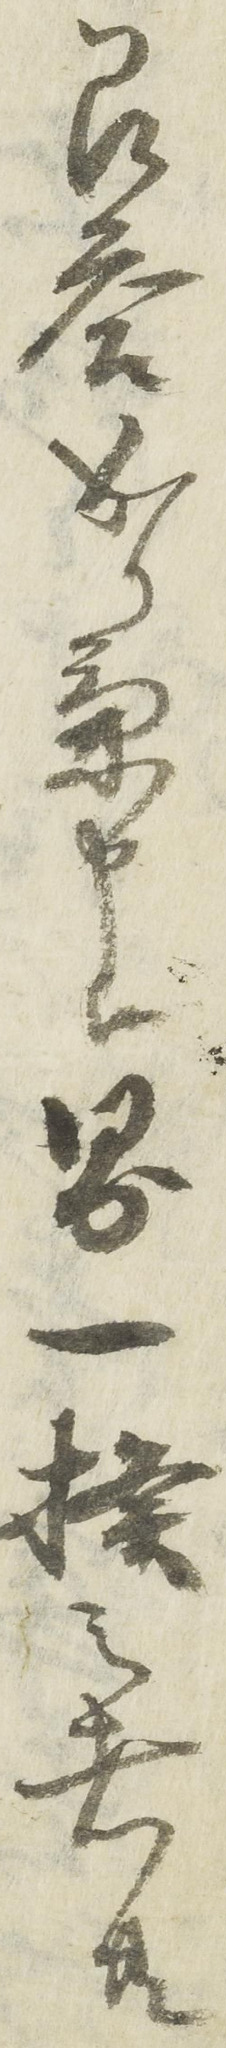即答成り兼申候則一揆之者共
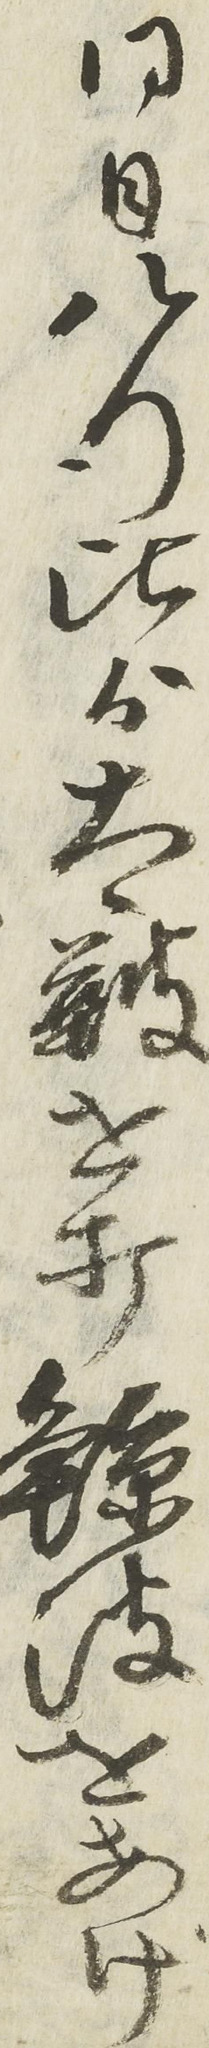同日八つ比ゟ太鼓を打鯨波をあげ
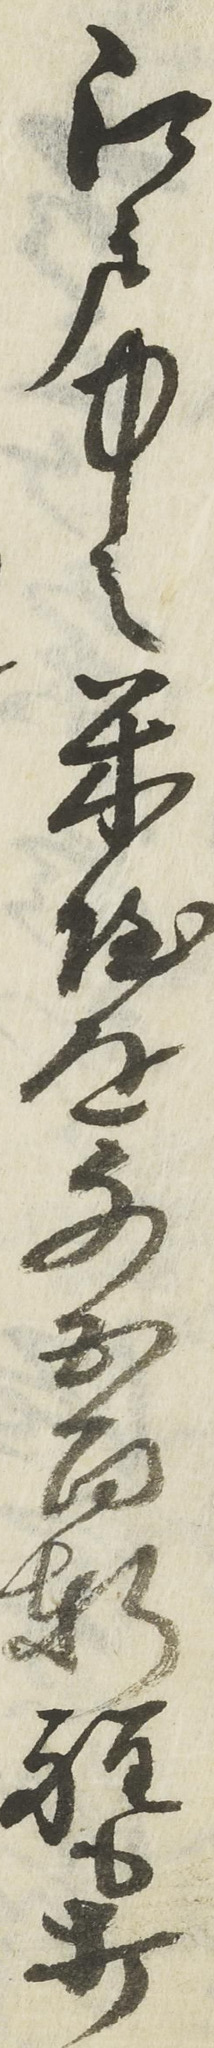江戸中之米屋を千五百軒程も打
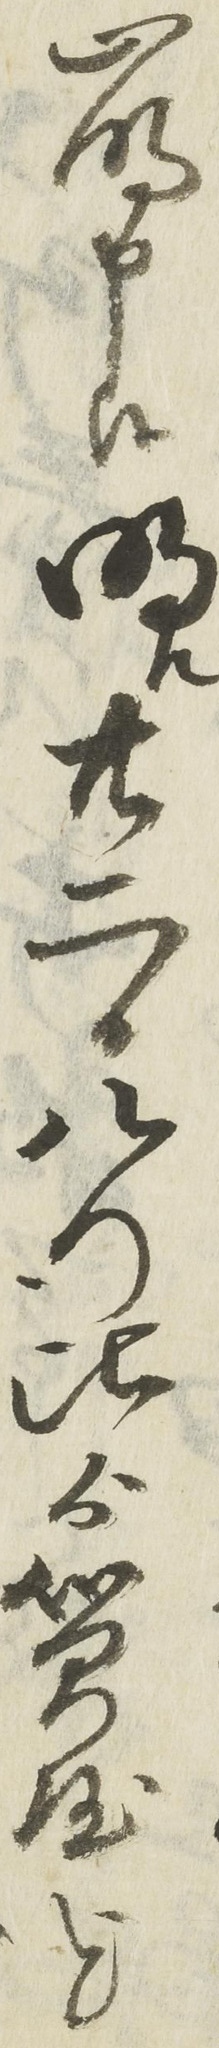崩申候明ル廿二日八つ比ゟ質屋を
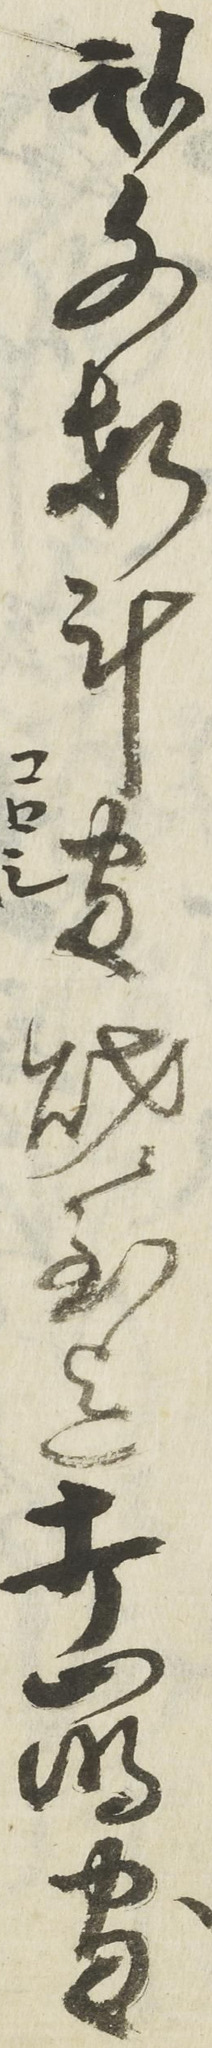弐千軒計家財ニ到迄打崩家
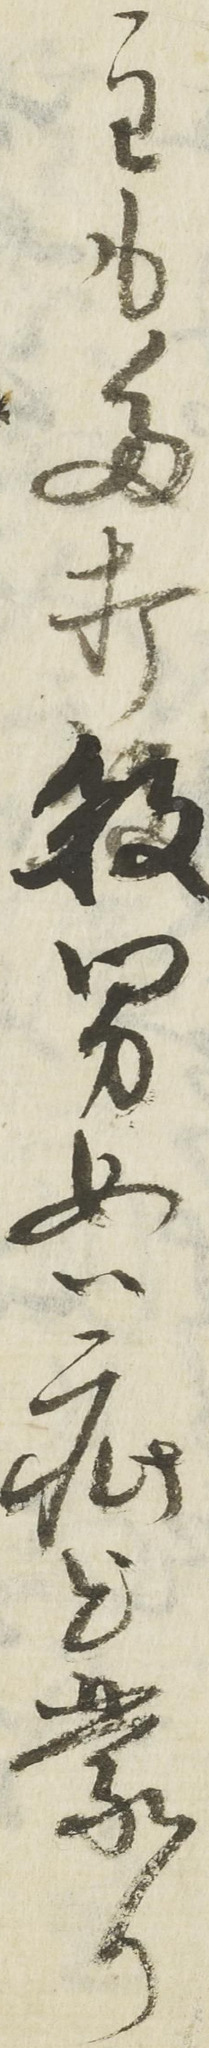主も多打殺男女は疵を蒙り
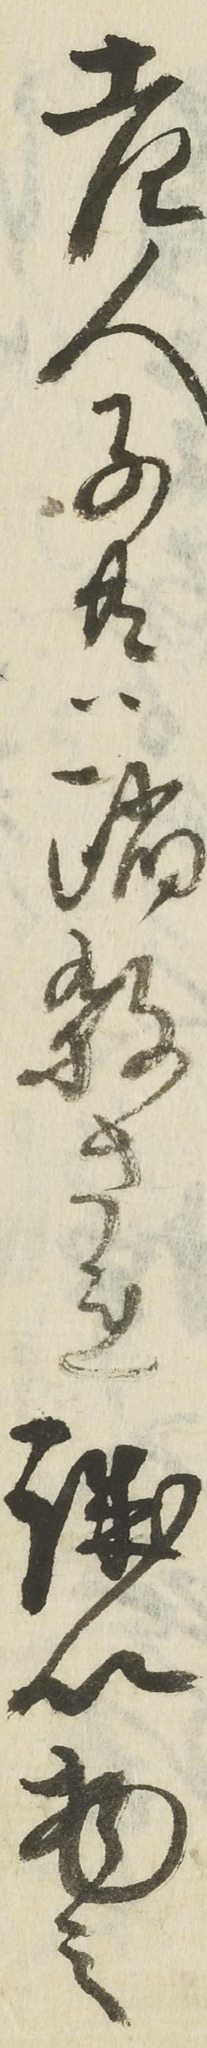老人子共は踏殺され誠以物之
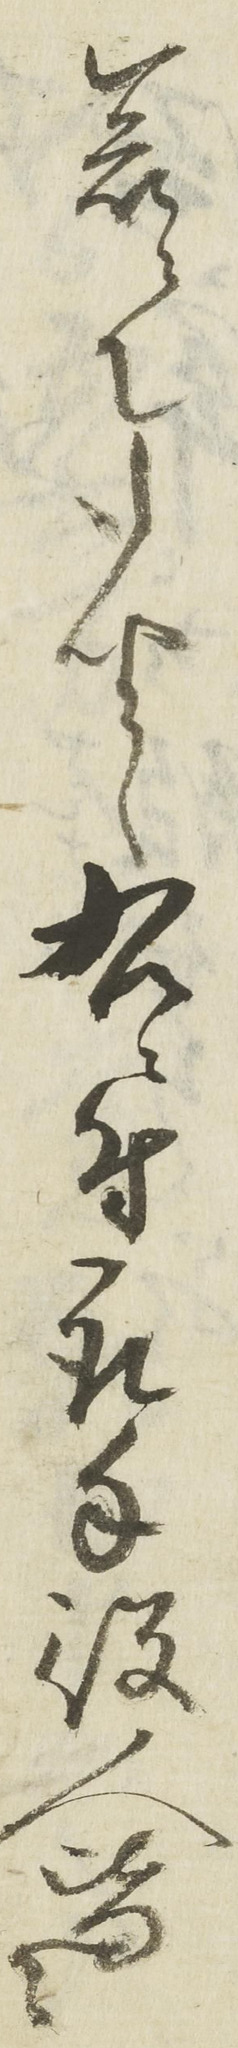哀ニて御坐候右ニ付取手役人皆〻
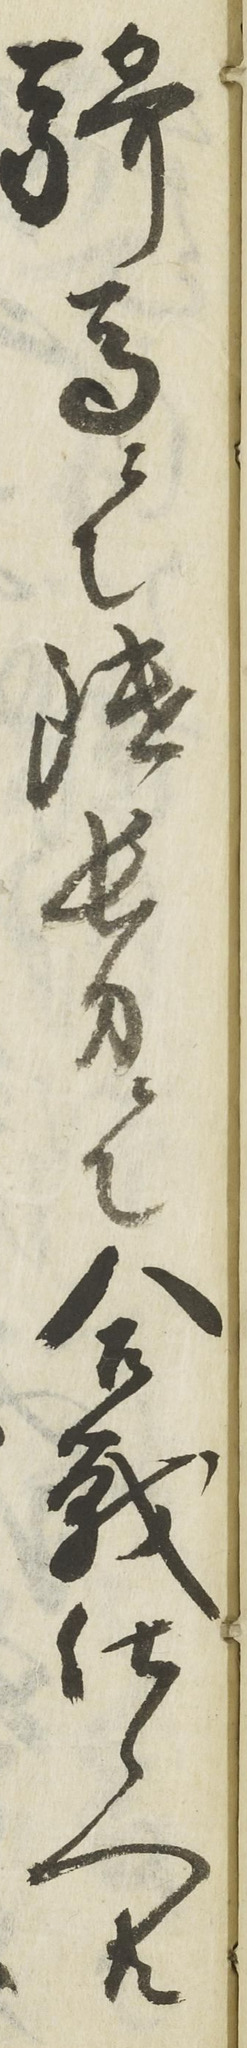騎馬ニて鑓長刀ニて合戦仕候へ共
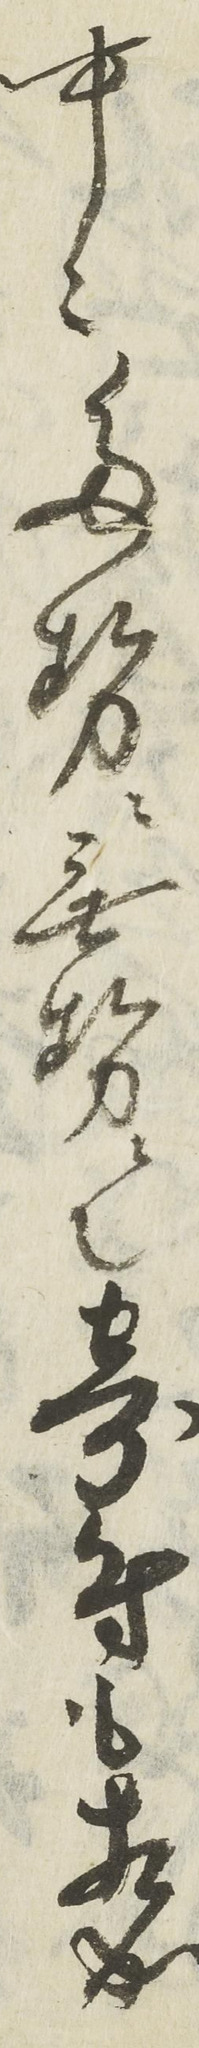中〻多勢ニ無勢ニて寄付も相成
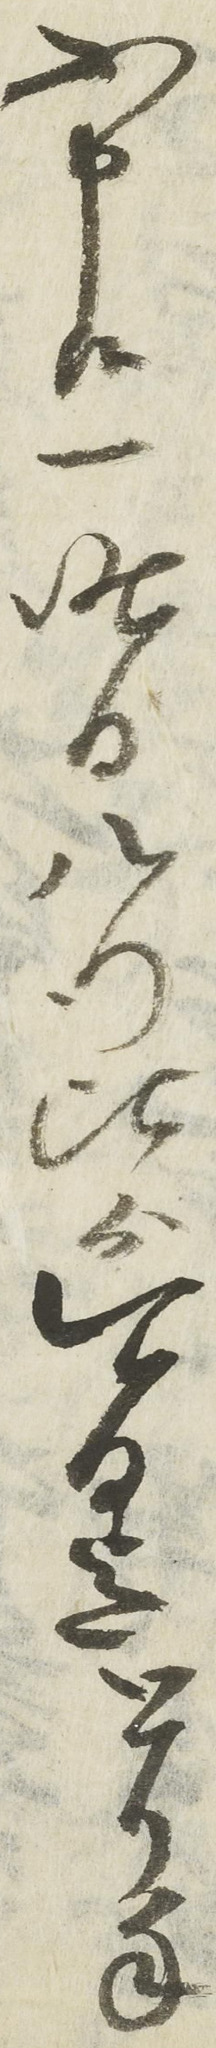不申候一昨日八つ比ゟ今日迄とり手
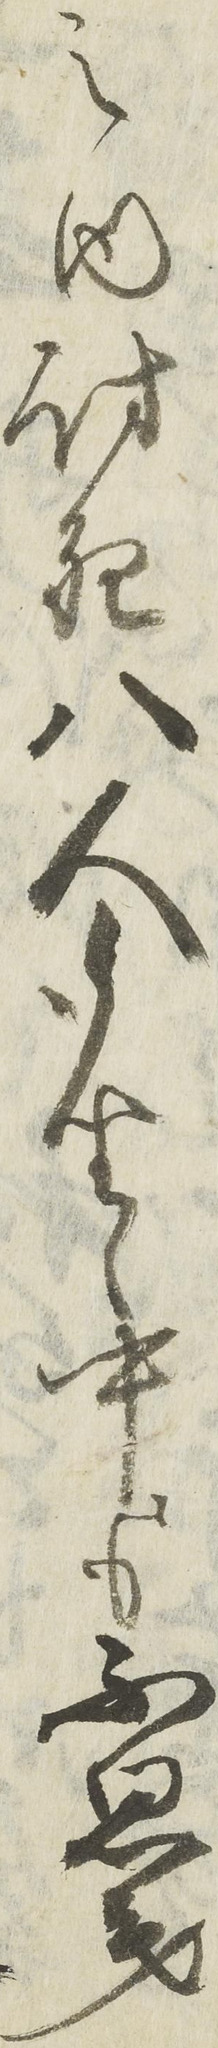之内討死八人御坐候中ニも不思義
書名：後見笑
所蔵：東京大学地震研究所図書室 Earthquake Research Institute Library, The University of Tokyo, JAPAN
